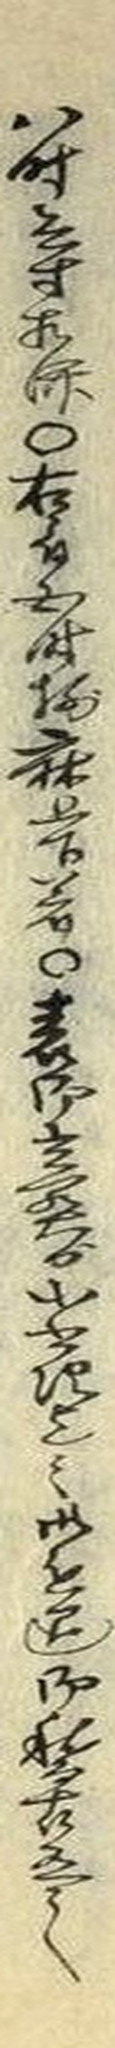八時壱寸相済〇右ニ付五時揃麻上下着〇表御玄関ゟ小書院迄之御進退御稽古有之
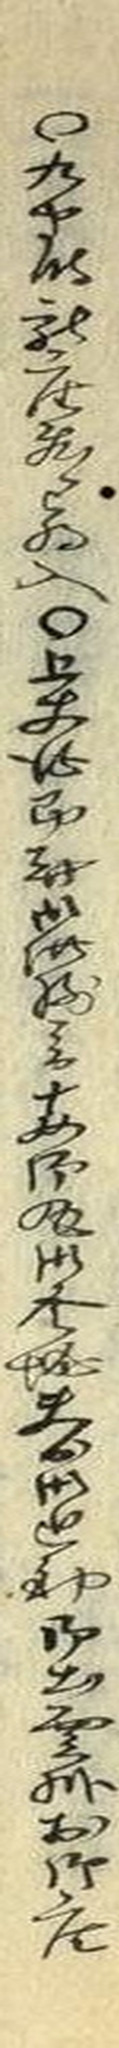〇九半時新座敷へ被為入〇上使後即刻御供揃ニ而両御丸御登城夫ゟ御廻勤御出殿掛於御座
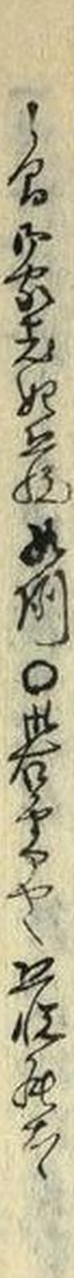之間御家老始恐悦如例〇御右筆部屋へ恐悦罷出候
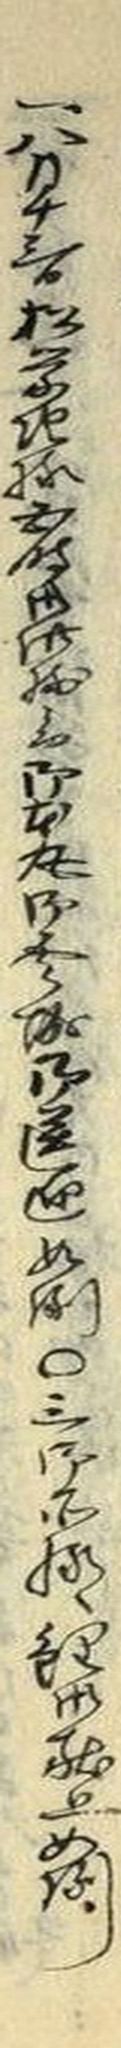一八月十三日松栄院様五時御供揃ニ而御本丸御登城御送迎如例〇三御所様へ鯉御献上如例
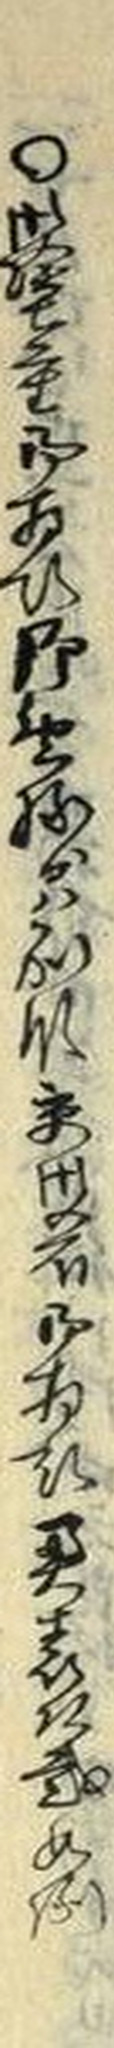〇御塗重御拝領御台様ゟハ別段交御肴御拝領奥表頂戴如例
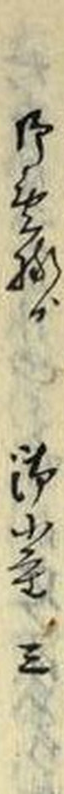御台様ゟ御小重三
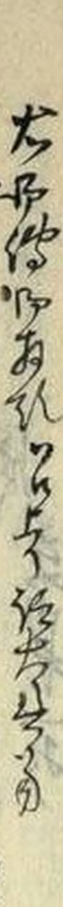右御伝御拝領召上り跡大奥御用
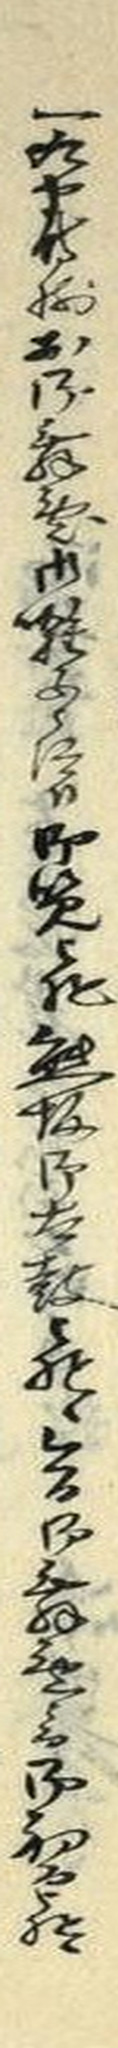一九半時揃於御舞台御囃子被仰付御覧被遊熊坂御太鼓被遊候今日御舞台ニ而御初而被遊候
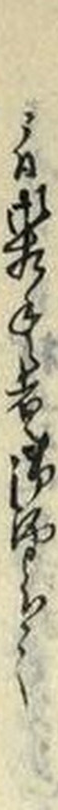ニ付御相手之者へ御酒被下之
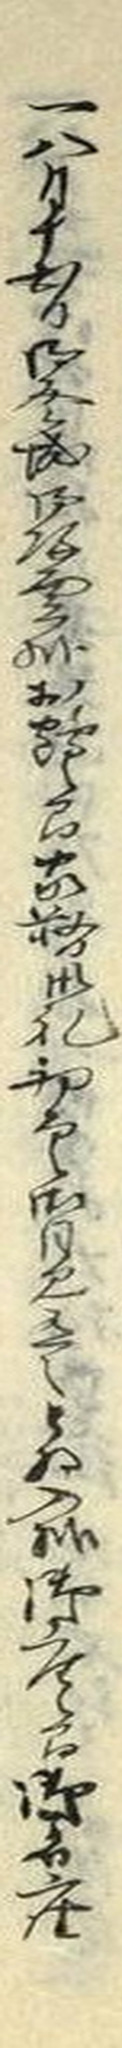一八月十五日御登城御帰殿掛於鶴之間家督御礼初而之御目見有之被為入掛御座之間御着座
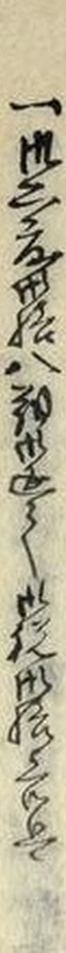一御二度御膳八朔御延之御祝御膳被召上候
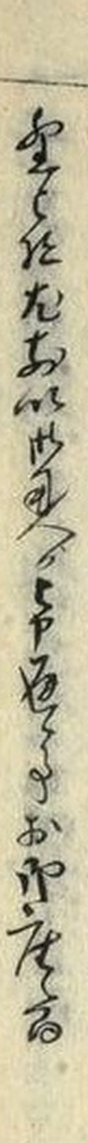逢被遊尤前以御用人ゟ被申通候事於御座之間
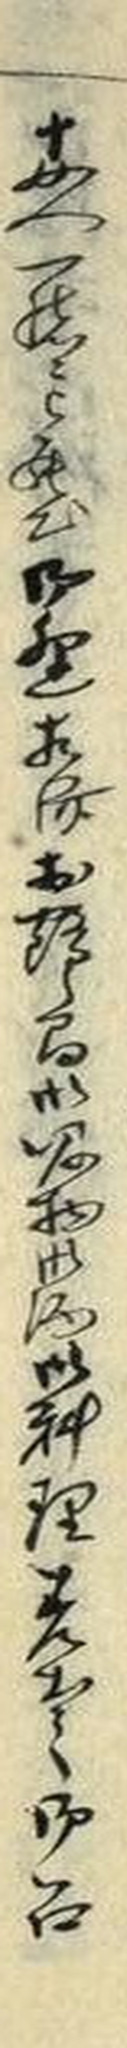両人一緒ニ被罷出御逢相済於鶴之間御吸物御酒御料理差出之御召

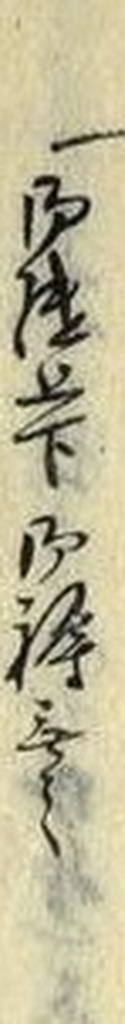御継上下御褥無之
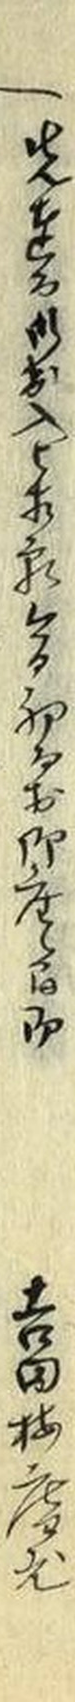先達而御出入被相願今日初而於御座之間御吉田梅庵老
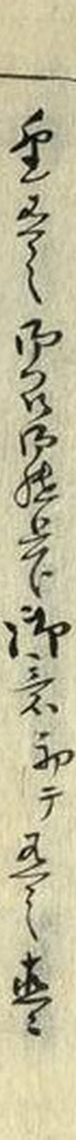逢有之御召御継上下御意初テ有之直ニ
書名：少傅日録抄（斉善付側向頭取日記、在府）
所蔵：福井県文書館 Fukui Prefectural Archives
